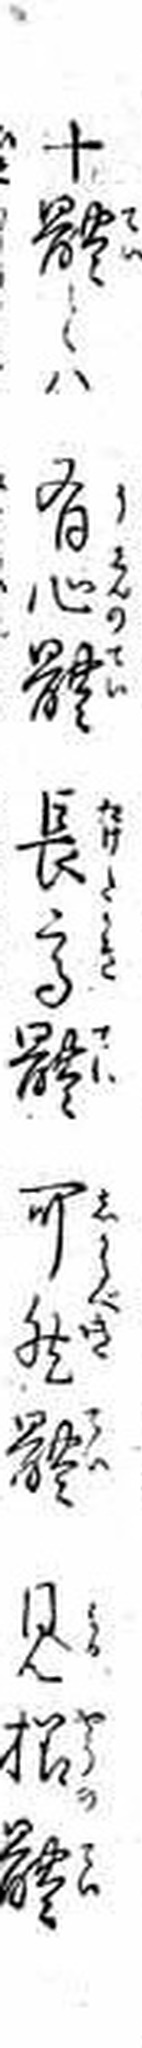十体とは有心体長高体可然体見様体
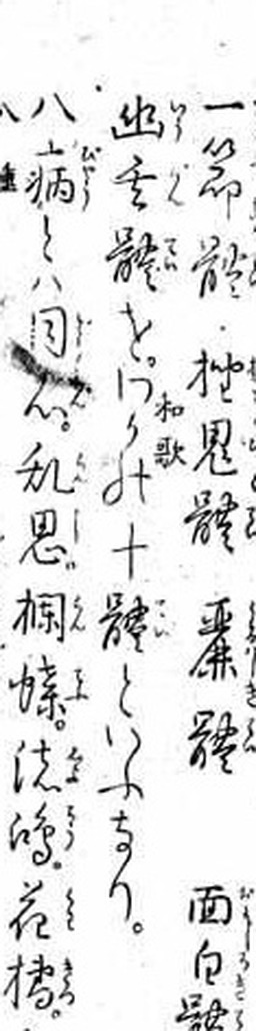幽玄体を。わかの十体といふなり。
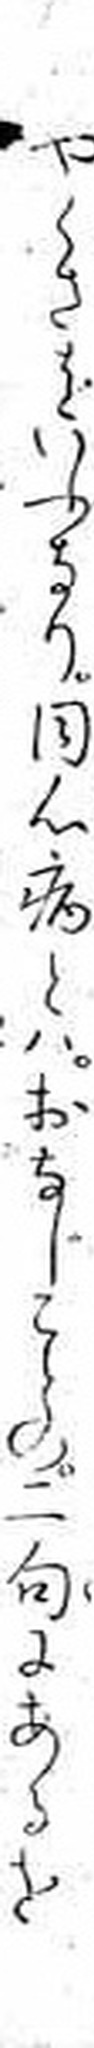やくさをいふなり。同心病とは。おなじことの。二句にあるを
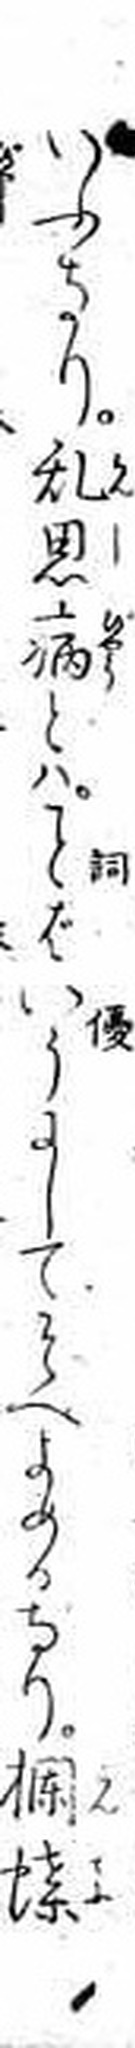いふなり。乱思病とは。ことばいうにしてそへよめるなり。欄蝶
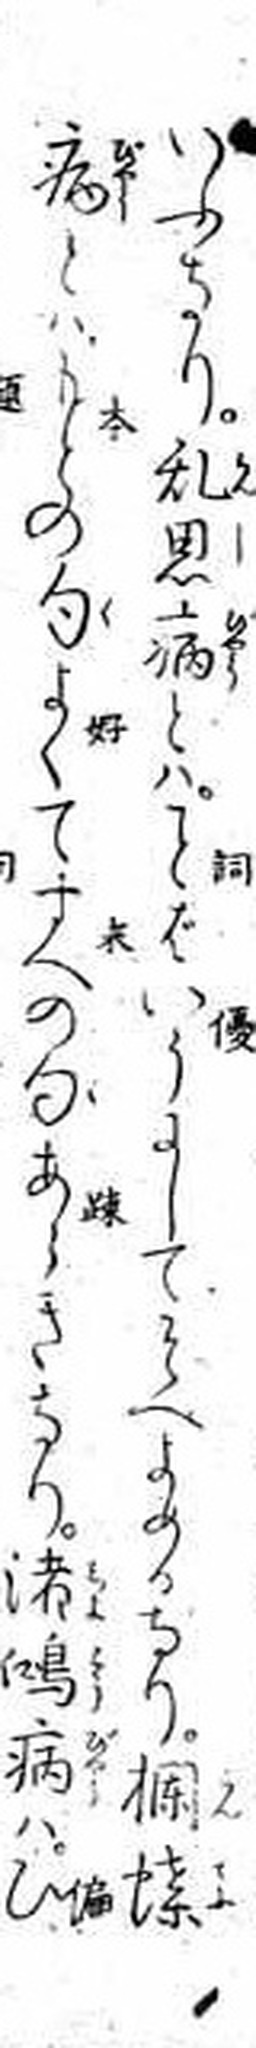病とは。もとの句よくてすへの句あらきなり。渚鴻病は。ひ
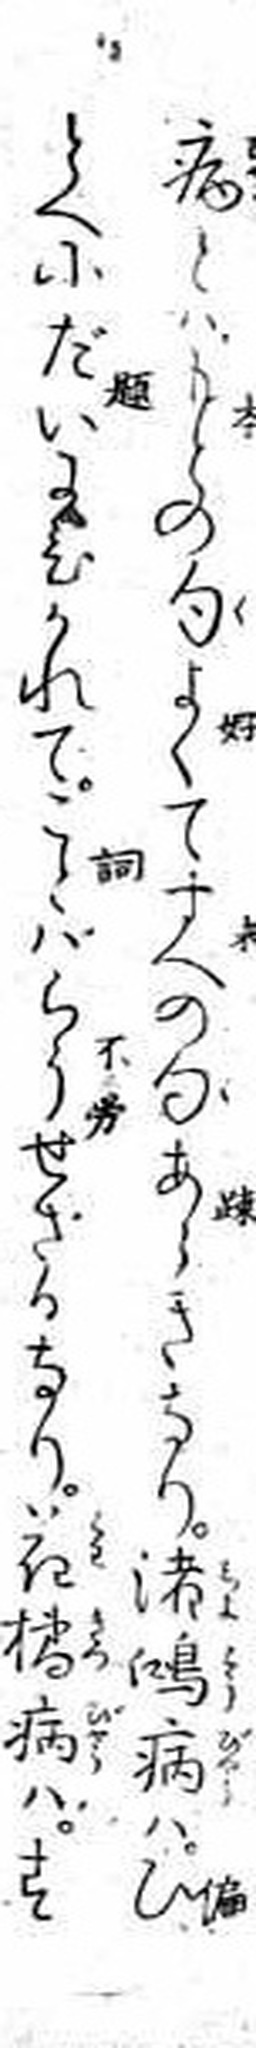とへにだいにひかれて。ことばらうせざるなり。花橘病は。す

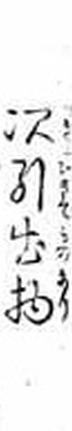次引出物
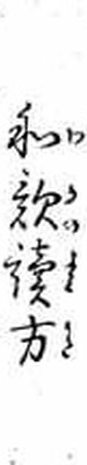和歌読方
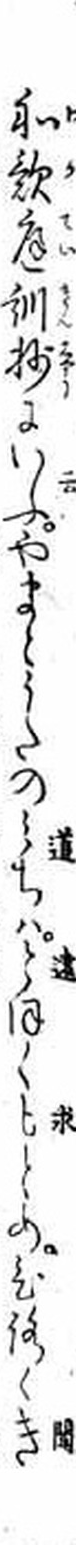和歌庭訓抄にいふ。やまとうたのみちは。とほくもとめ。ひろくき
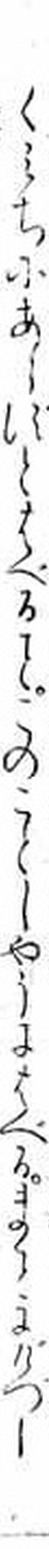くみちにあらずとはべること。このことしやうにはべる。まことにげつし
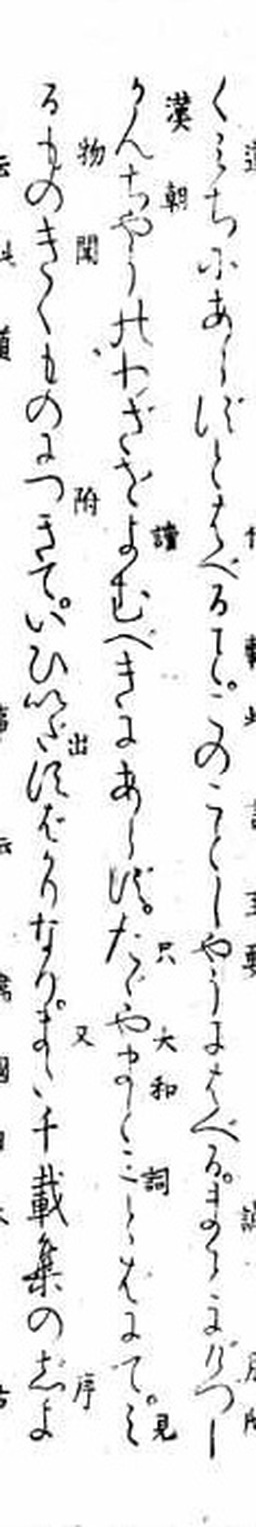かんちやうのわざをよむべきにあらず。たゞやまとことばにて。み
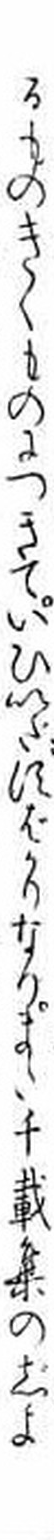るものきくものにつきて。いひいだすばかりなり。また千載集のじよ
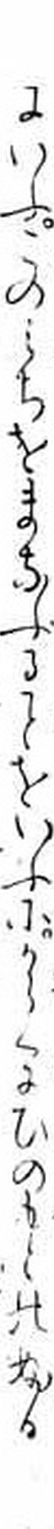にいふ。このみちをまなぶることをいふに。からくにひのもとのふる
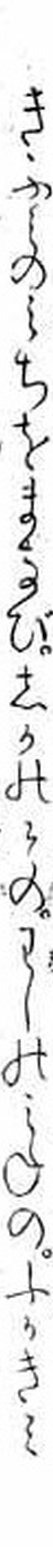きふみのみちをまなび。しかのその。わしのみねの。ふかきみ
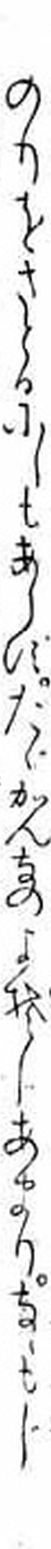のりをさとるにしもあらず。たゞかんなのよそじあまり。なゝもじ
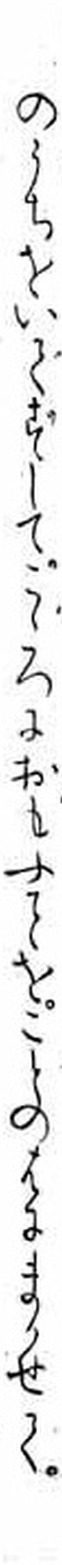のうちをいでずして。こゝろにおもふことを。ことのはにまかせて。
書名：女学範
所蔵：東京学芸大学教育コンテンツアーカイブ
